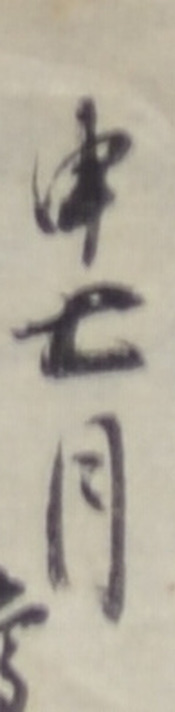申七月
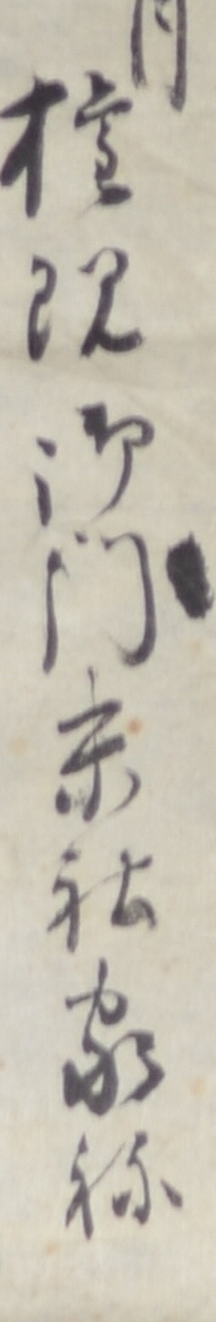権現御門末松家称

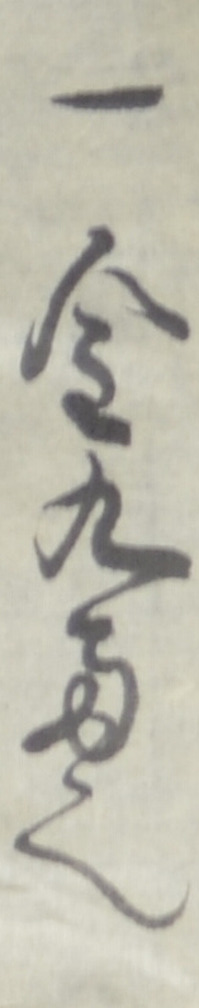一金九両也
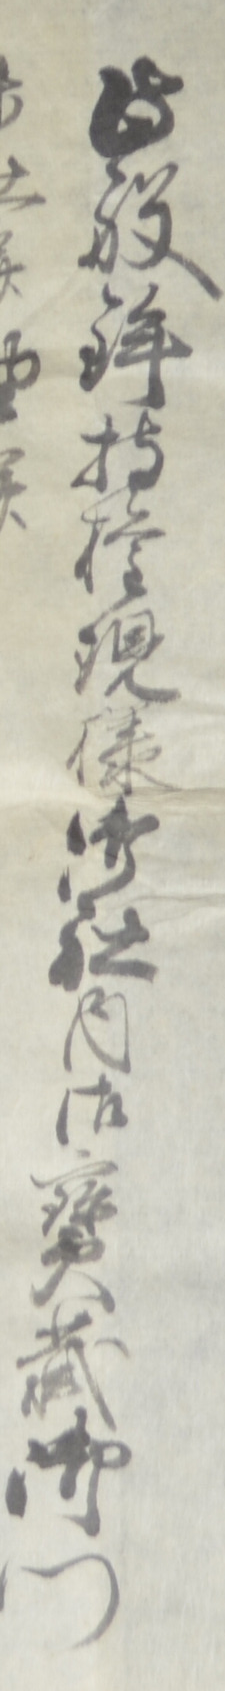此般鉾持権現様御社内御宝蔵御門
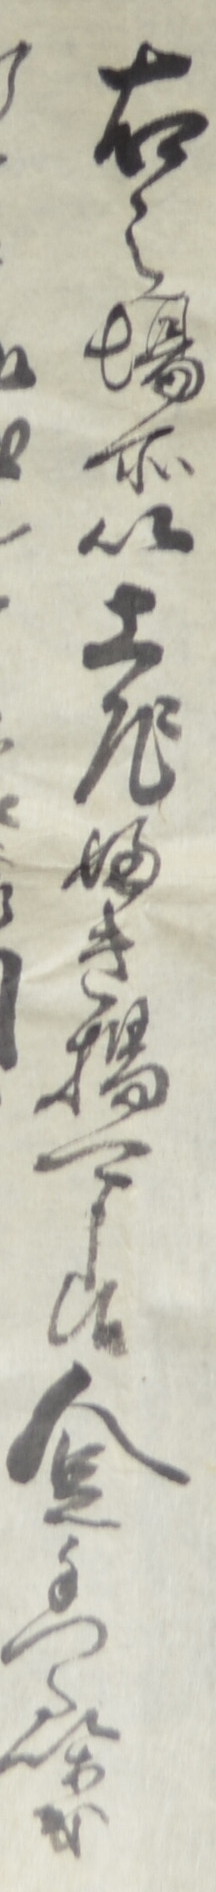右之場所以土蔵ふき揚可申候人足手間以等義
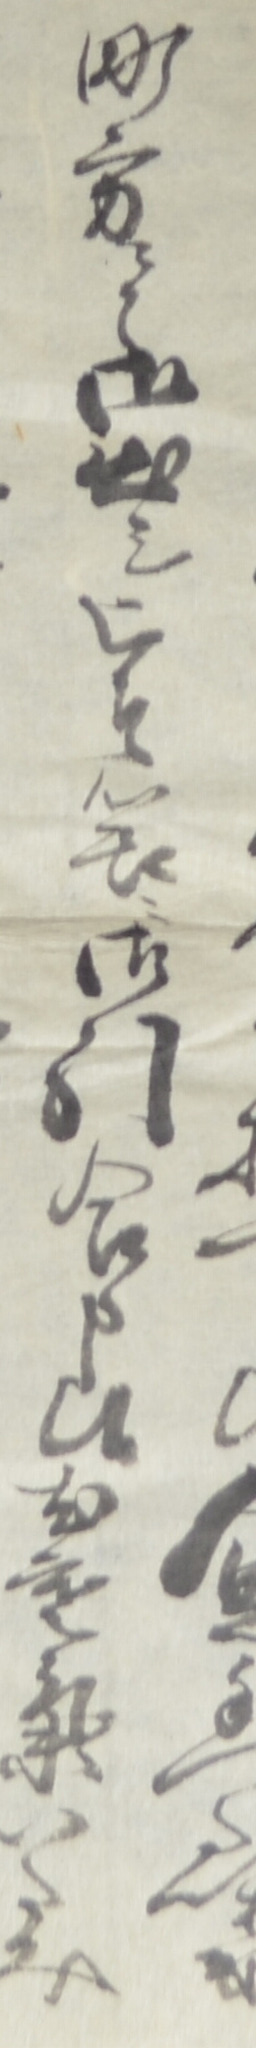町方ニて御出シ被下筈ニ御引合申候尤寒気いたみ
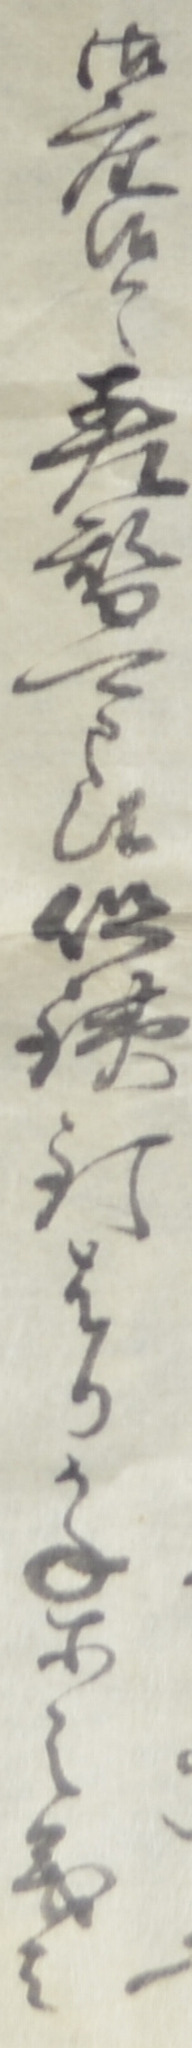御座候ハヽ差替可申候但鉄打はりかね等之義は
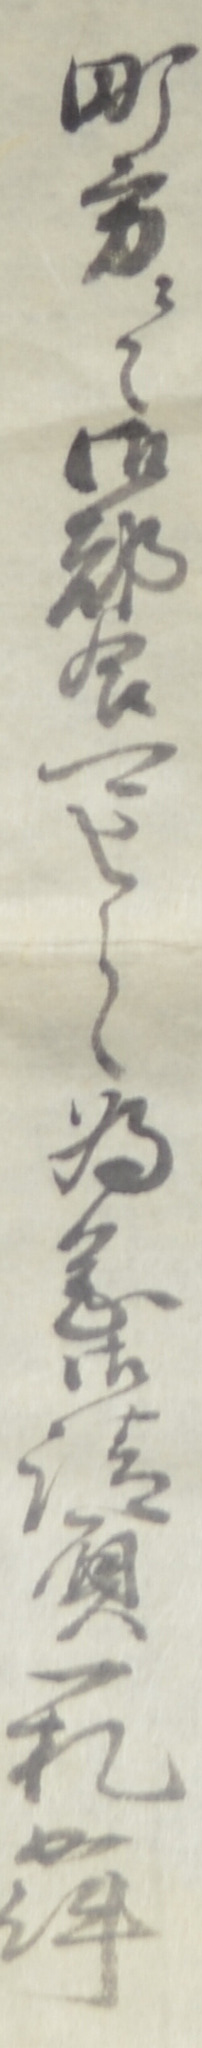町方ニて御都合可申之候為念御請負一札如件
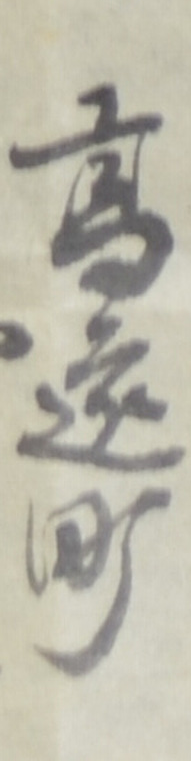高遠町
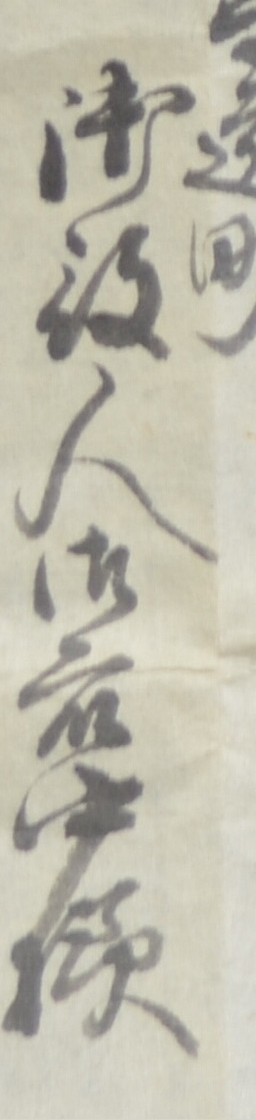御役人御衆中様
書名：覚
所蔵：伊那市立高遠町図書館・合同会社AMANE
